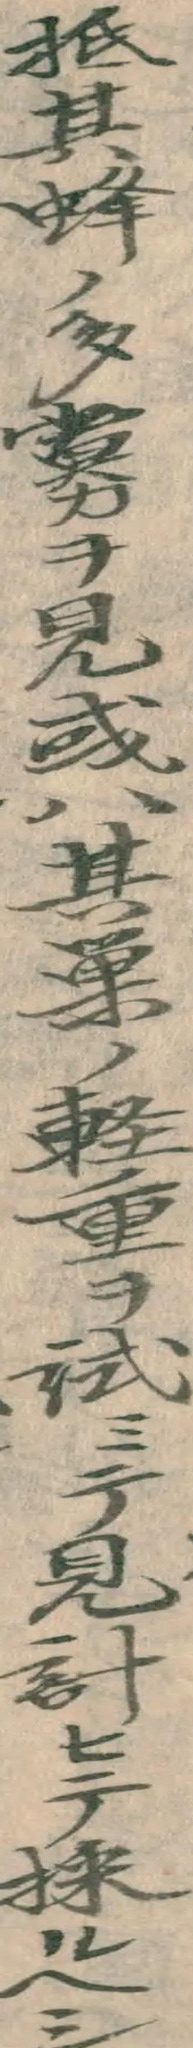抵其蜂ノ多寡ヲ見或ハ其巣ノ軽重ヲ試ミテ見計ヒテ採ルヘシ
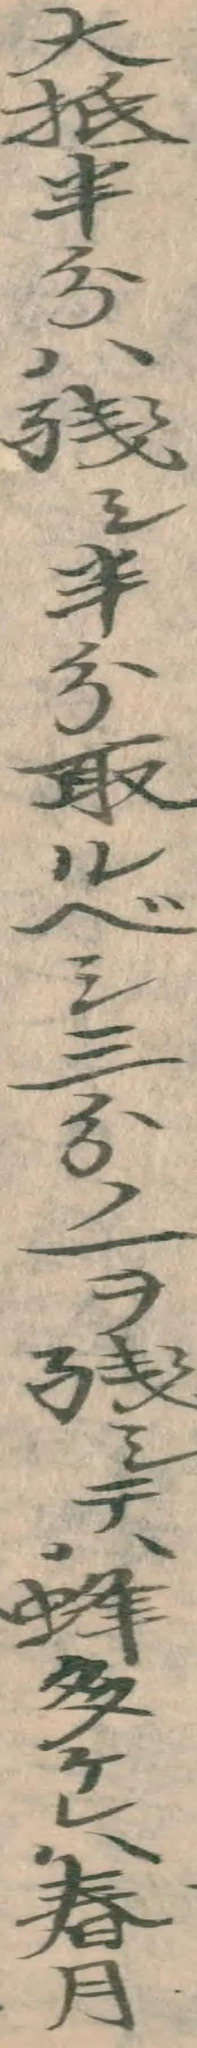大抵半分ハ残シ半分取ルベシ三分ノ一ヲ残シテハ蜂多ケレハ春月
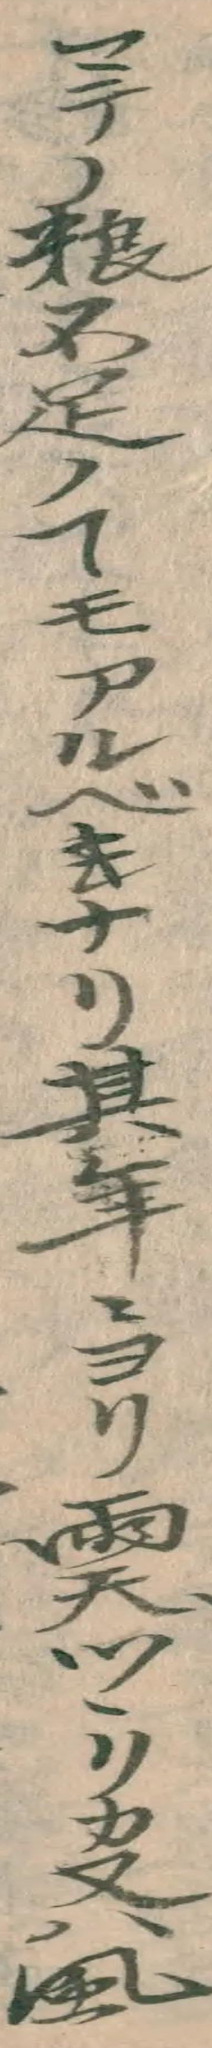マテノ粮不足ノコトモアルベシキナリ其年ニヨリ雨天ツヽクカ又ハ風
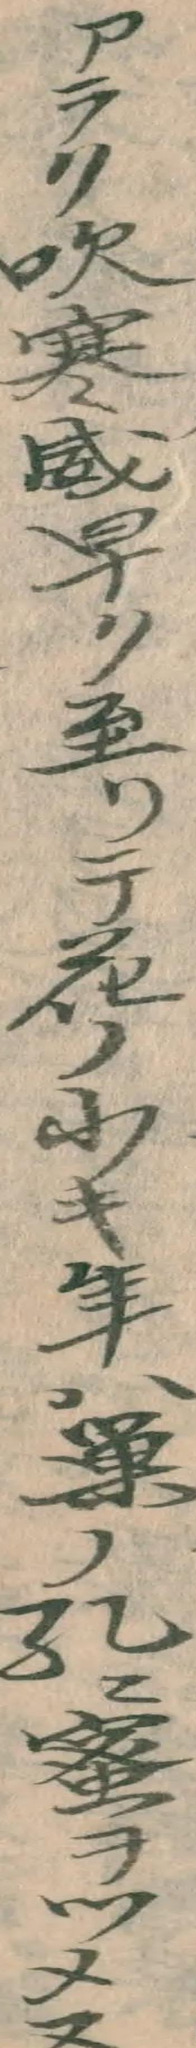アラク吹寒威早ク至リテ花ノ少キ年ハ巣ノ孔ニ蜜ヲツメヌ
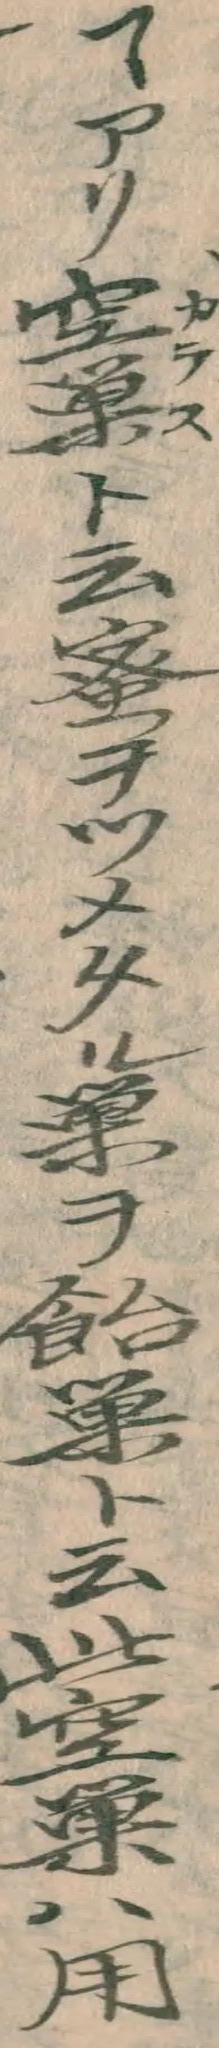コトアリ空巣ト云蜜ヲツメタル巣ヲ飴巣ト云此空巣ハ用
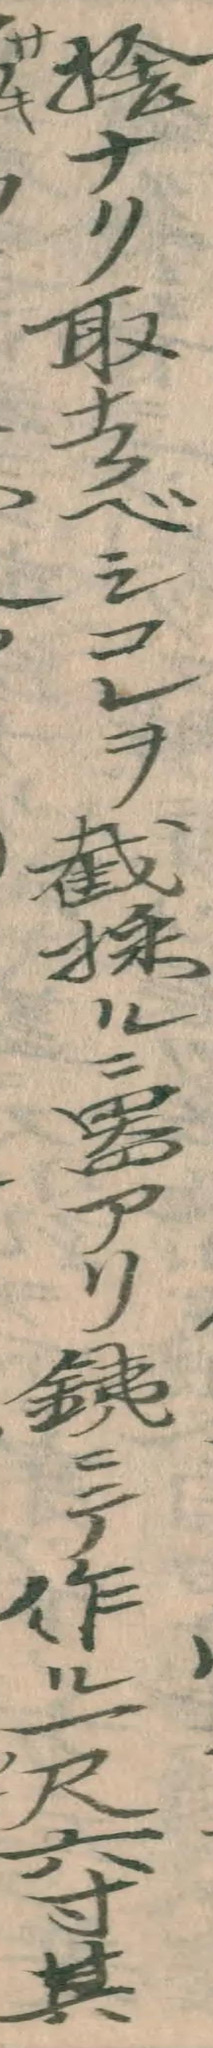捨ナク取去ベシコレヲ截採ルニ器アリ銕ニテ作ル一尺六寸其
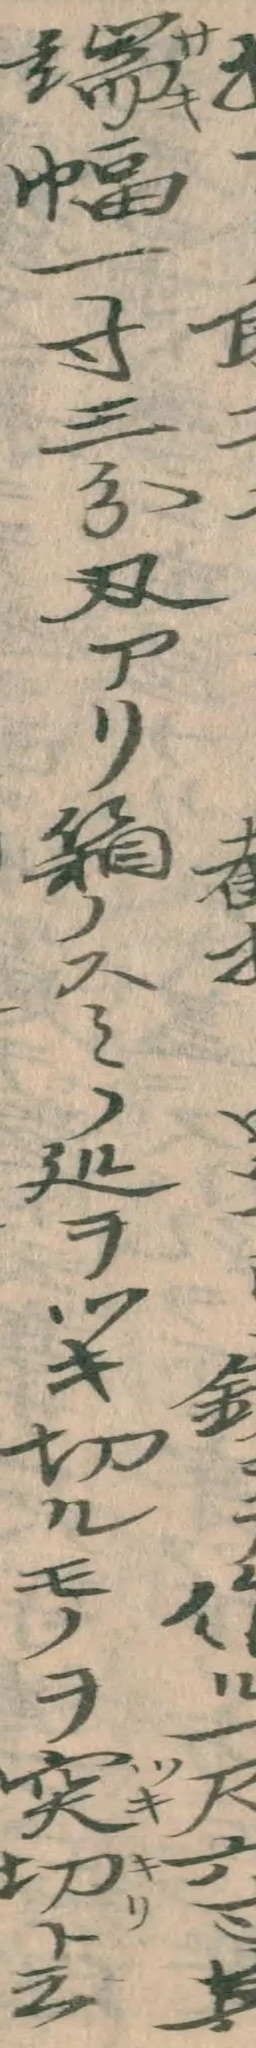端幅一寸三分刄アリ箱ノスミノ処ヲツキ切ルモノヲ突切ト云
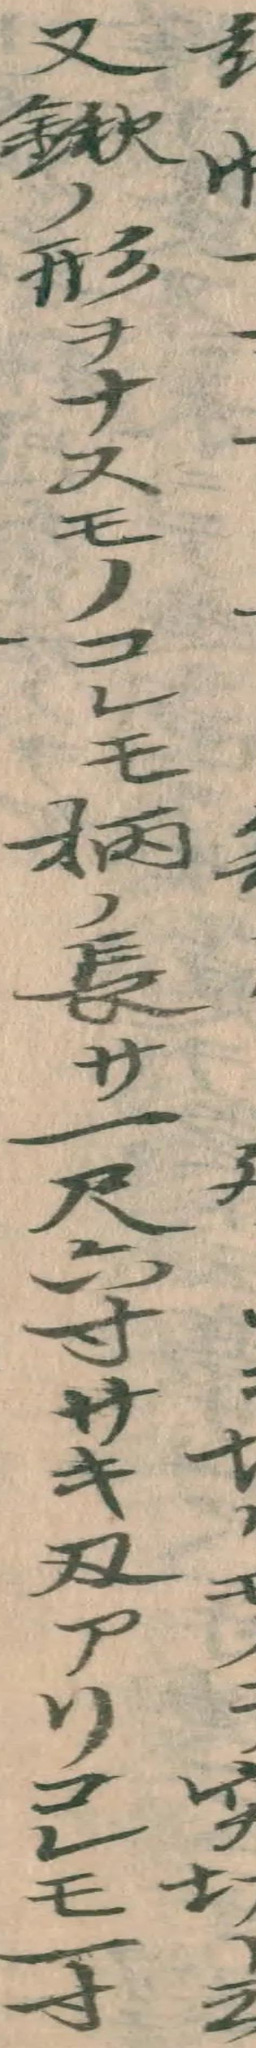又鍬ノ形ヲナスモノコレモ柄ノ長サ一尺六寸サキ刄アリコレモ一寸
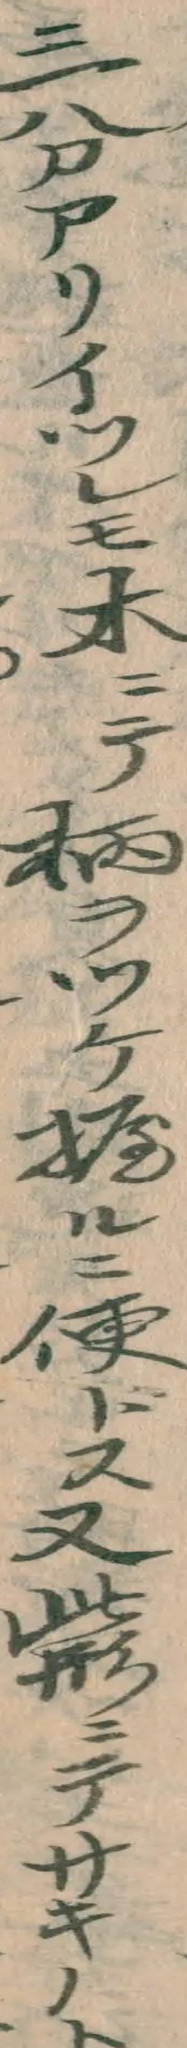三分アリイツレモ木ニテ柄ヲツケ握ルニ便トス又此形ニテサキノト
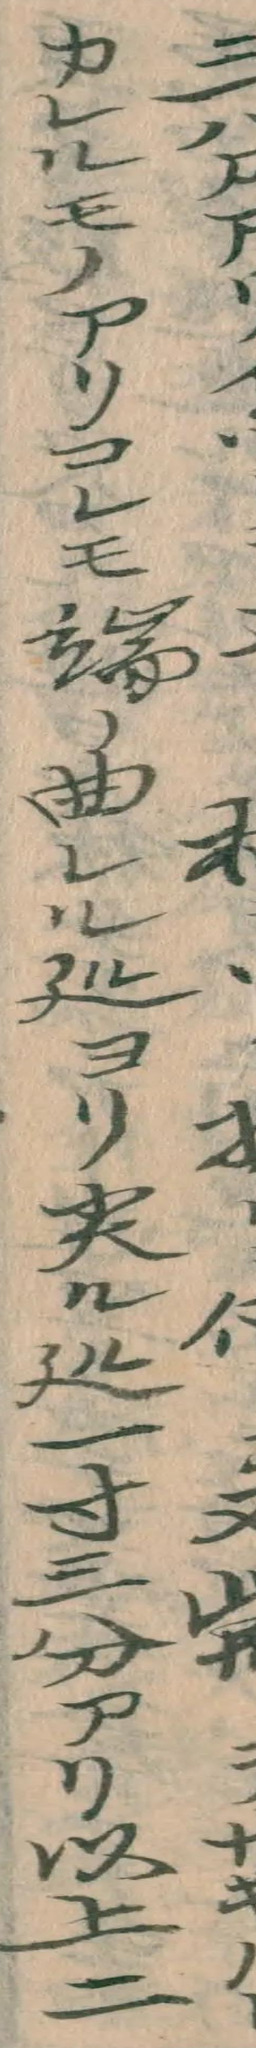カレルモノアリコレモ端ノ曲レル処ヨリ尖ル処一寸三分アリ以上二
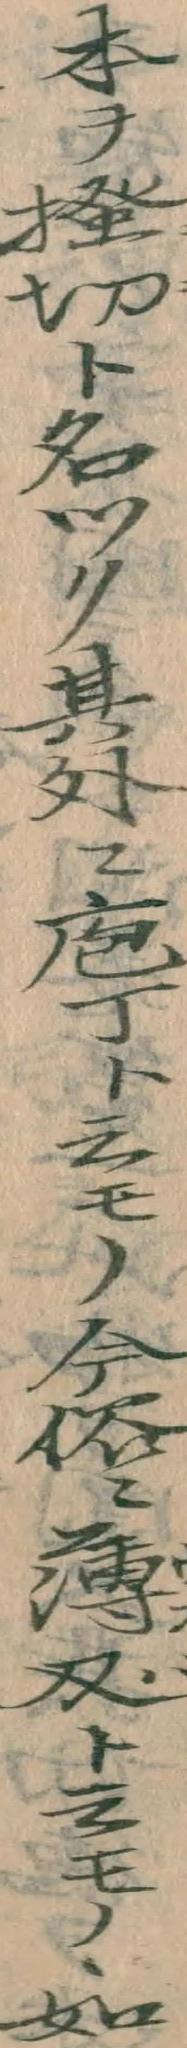本ヲ掻切ト名ツク其外ニ庖丁ト云モノ今俗ニ薄刄ト云モノヽ如
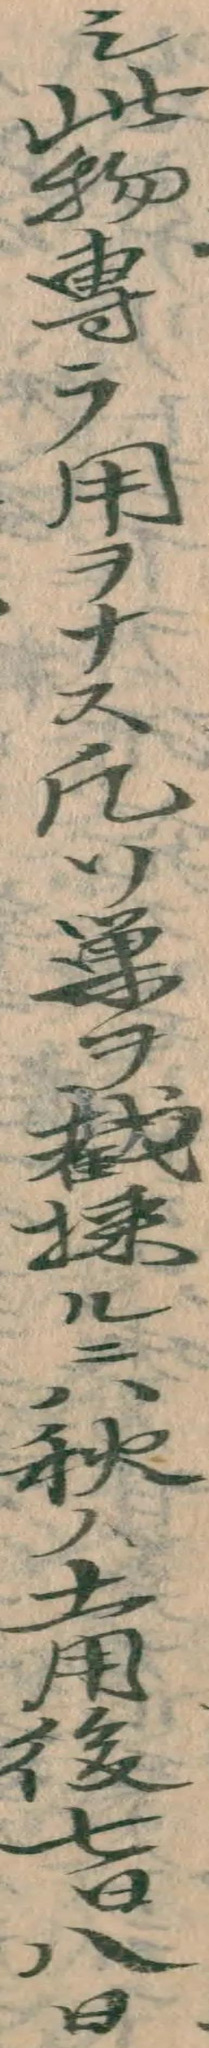シ此物専ラ用ヲナス凡ソ巣ヲ截採ルニハ秋ノ土用後七日八日
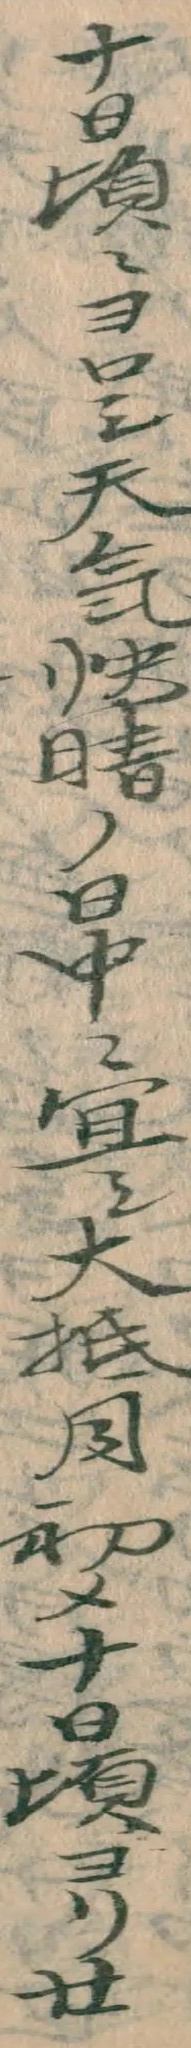十日頃ニヨロシ天気快晴ノ日中ニ宜シ大抵月初メ十日頃ヨリ廿
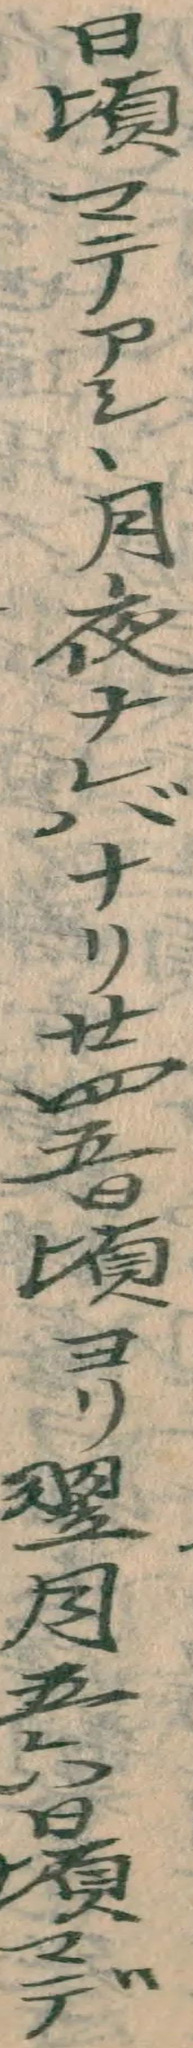日頃マテアシヽ月夜ナレバナリ廿四五日頃ヨリ翌月五六日頃マデ
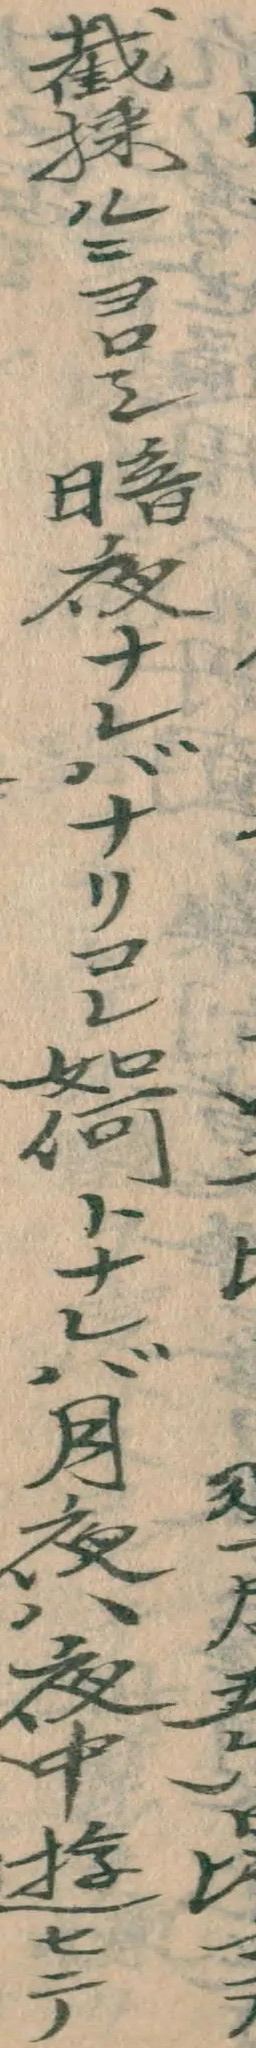截採ルニヨロシ暗夜ナレバナリコレ如何トナレバ月夜ハ夜中遊ヒテ
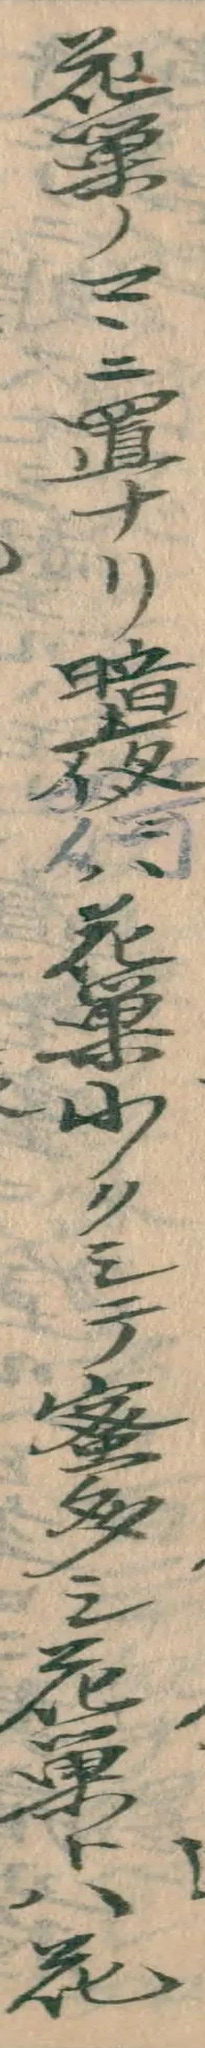花巣ノマヽニ置ナリアンヤ暗夜ニハ花巣少クシテ蜜多シ花巣トハ花
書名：千蟲譜 3巻. [1]
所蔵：国立国会図書館 National Diet Library, JAPAN
